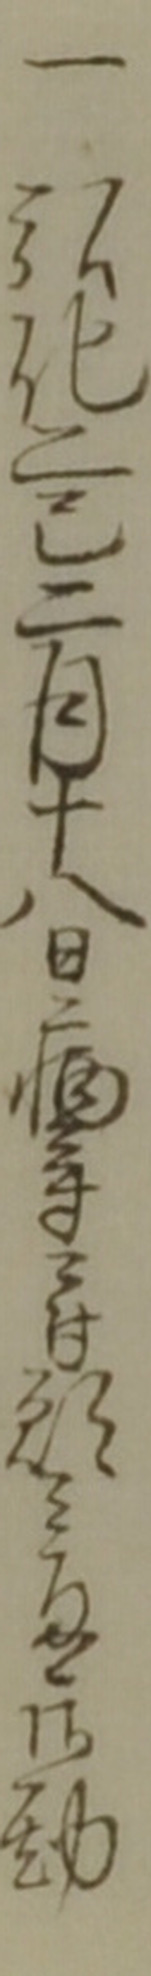一弘化二巳二月十八日病気ニ付願之通御勘
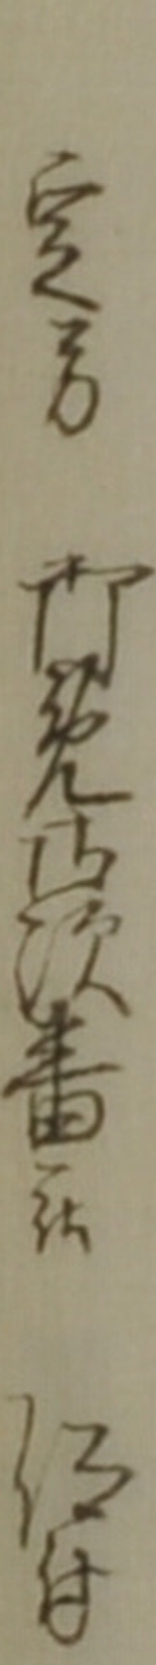定方御免御次番被仰付
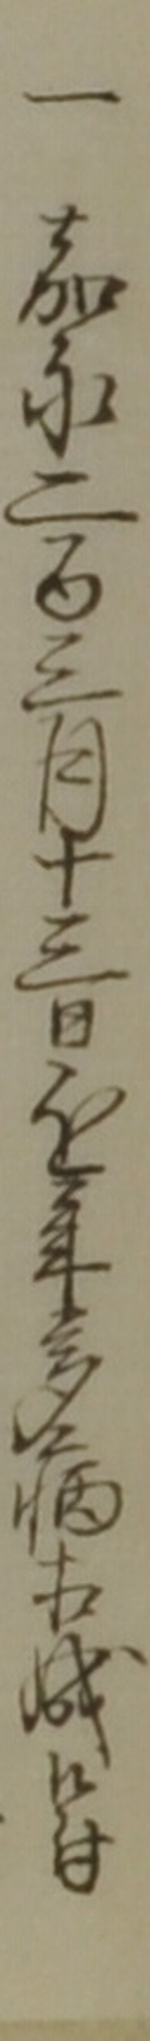一嘉永二酉三月十三日近年多病相成候付
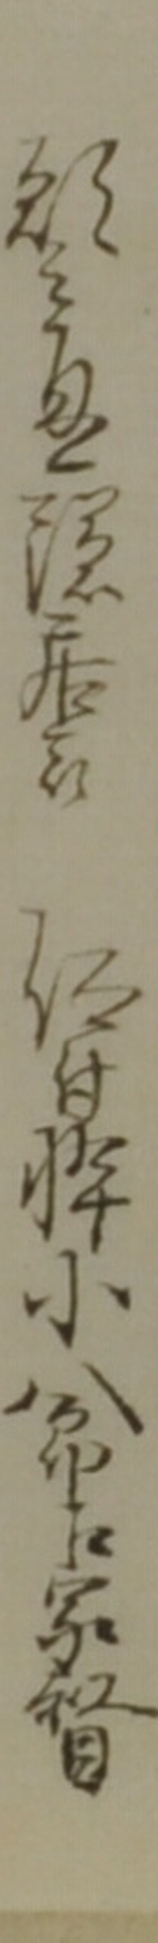願之通隠居被仰付忰小八郎江家督
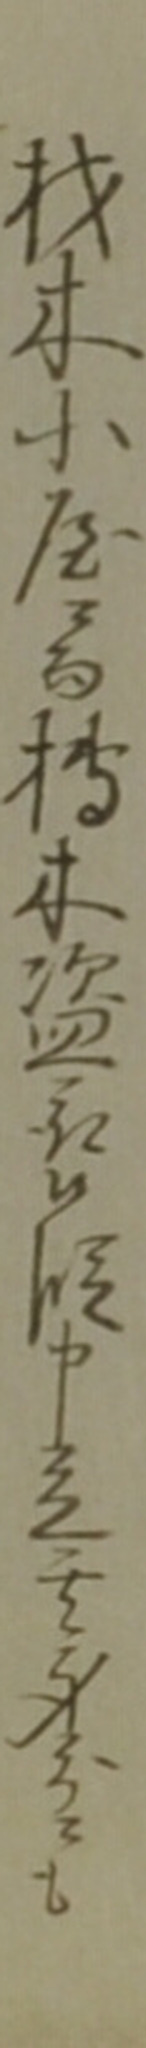材木小屋ニ而榑木盗取候段申立其身文ニも
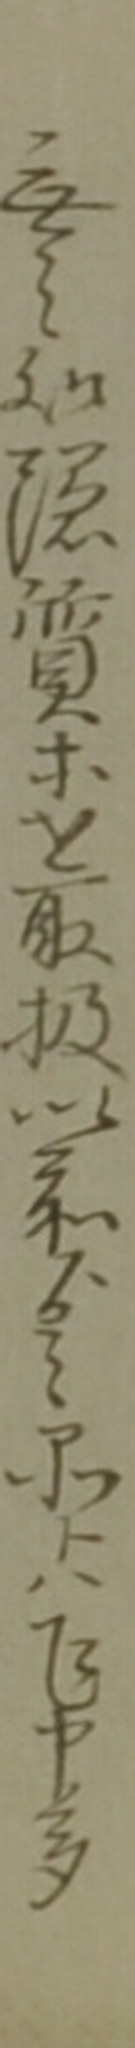無之処隠質等を取扱以前ゟ之品トハ乍申多
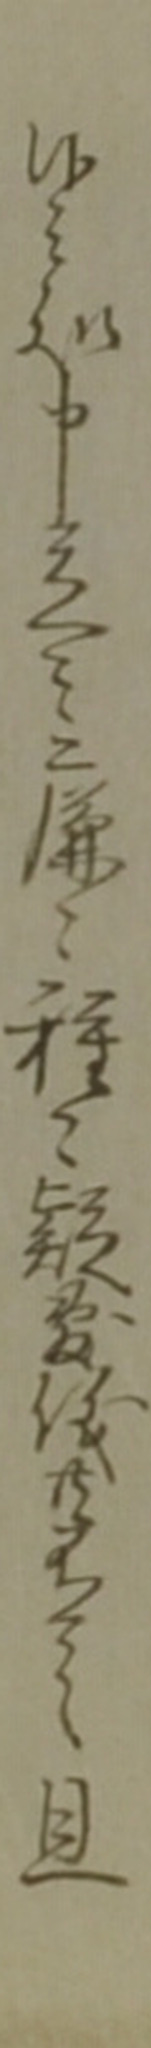候之処申立之廉々種々疑敷儀共有之且
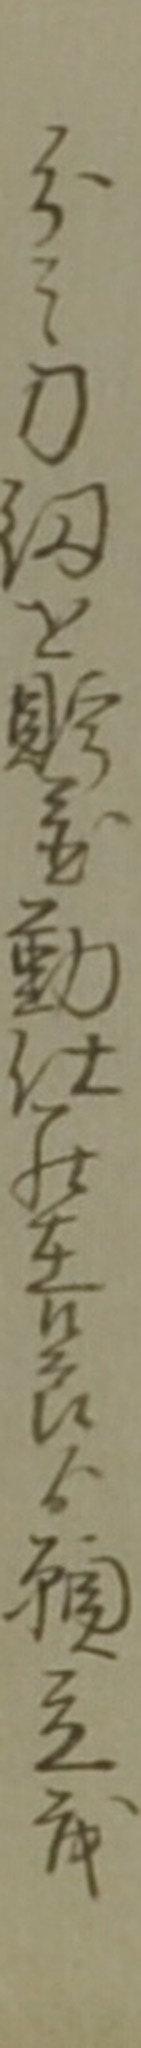分之刀釼を貯置勤仕罷在候節願立茂

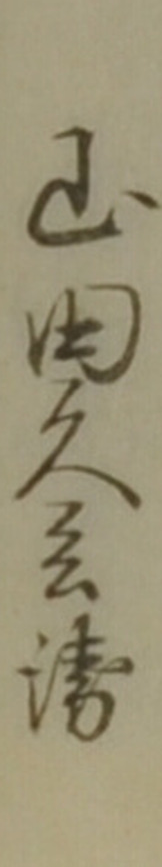山田久兵衛

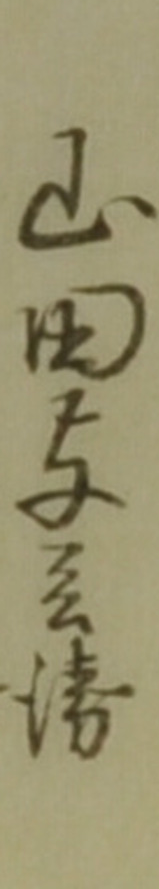山田与兵衛
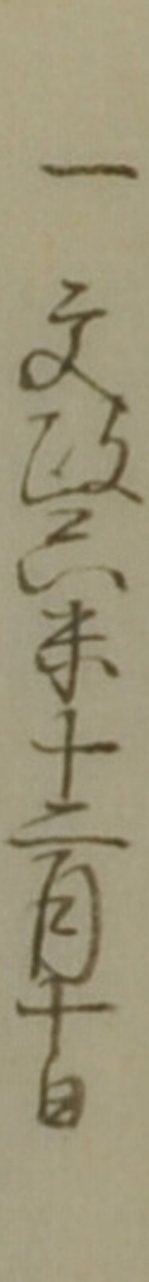一文政六未十二月十日

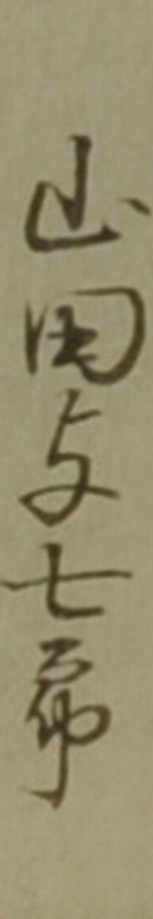山田与七郎

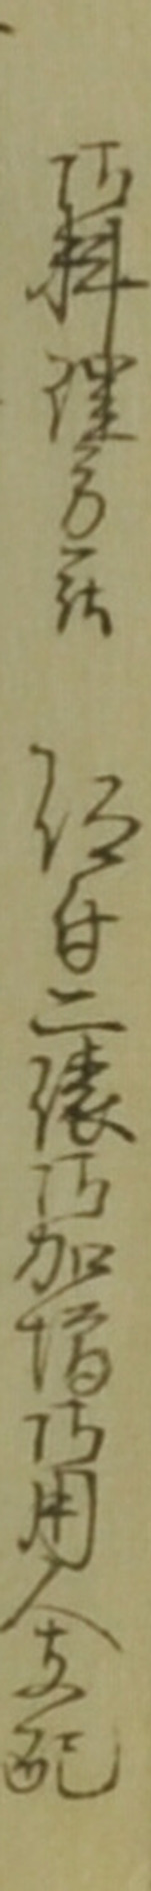御料理方被仰付二俵御加増御用人支配
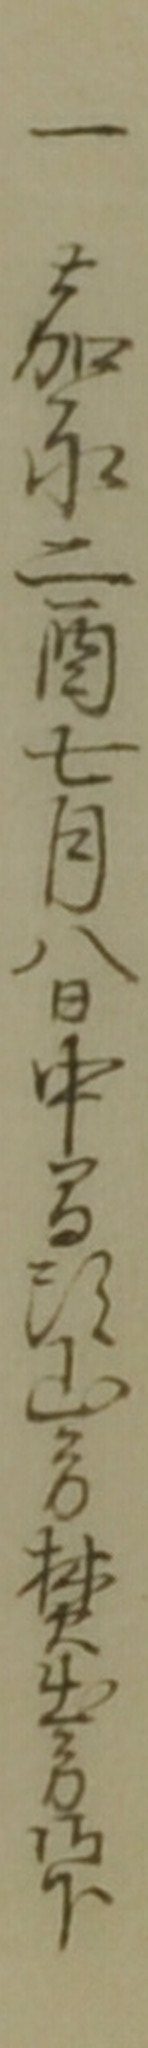一嘉永二酉七月八日中間頭山方焚出方御下
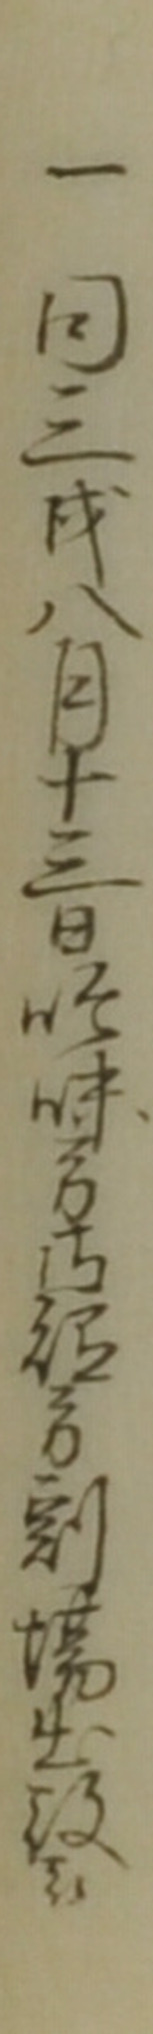一同三戌八月十三日吟味方御賄方割場出役被
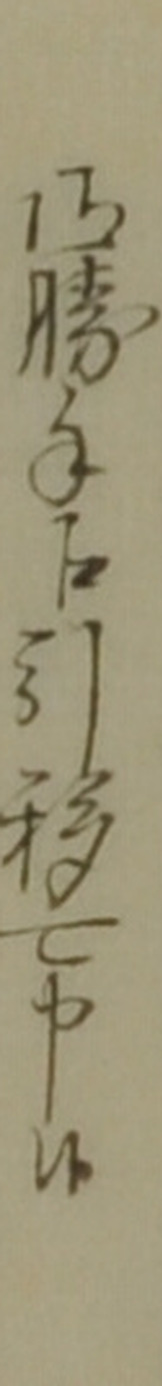御勝手江引移可申候
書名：無足廃家（壱）
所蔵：伊那市立高遠町図書館・合同会社AMANE
